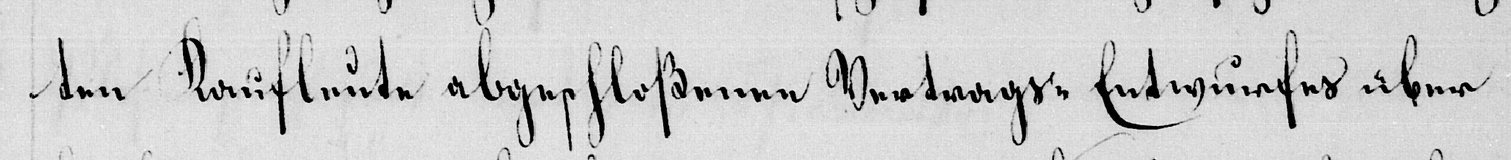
ten Kaufleute abgeschloßenen Vertrags-Entwurfes über
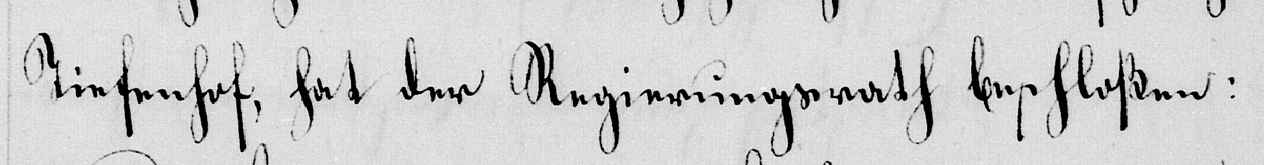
Tiefenhof, hat der Regierungsrath beschloßen:
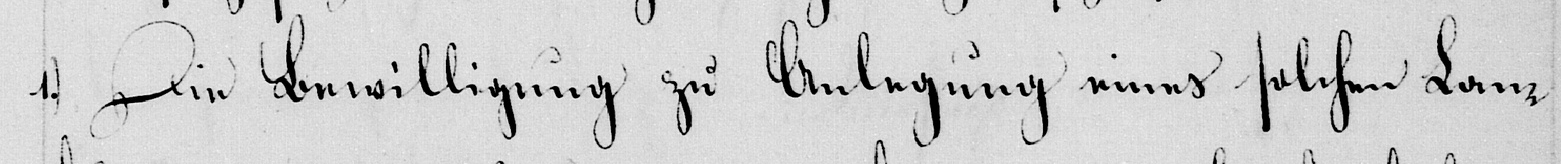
1.) Die Bewilligung zu Anlegung eines solchen Lan¬
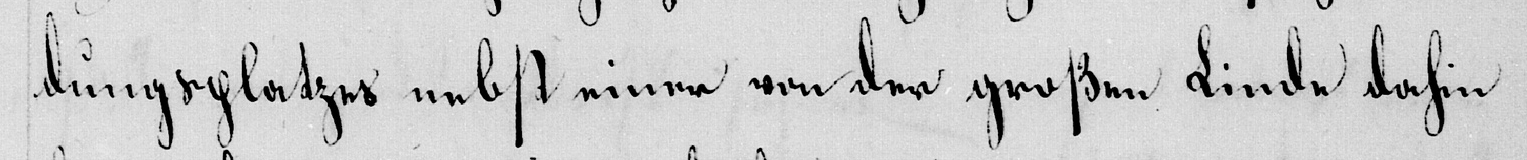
dungsplatzes nebst einer von der großen Linde dahin
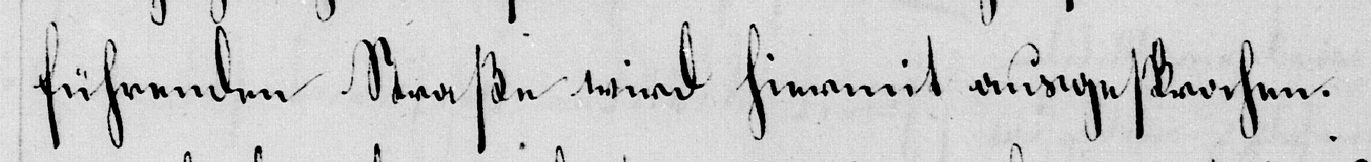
führenden Straße wird hiermit ausgesprochen.
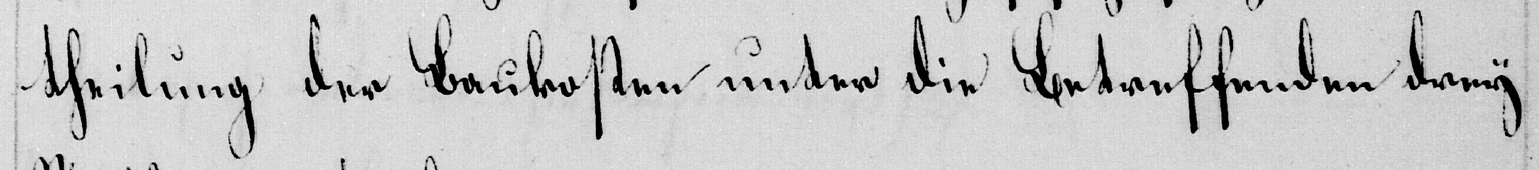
theilung der Baukosten unter die Betreffenden drey
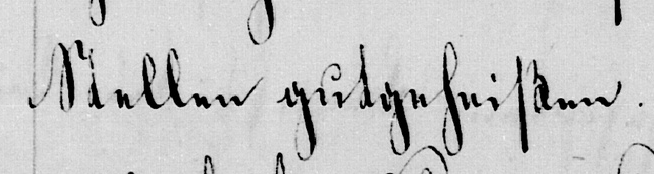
Stellen gutgeheißen.
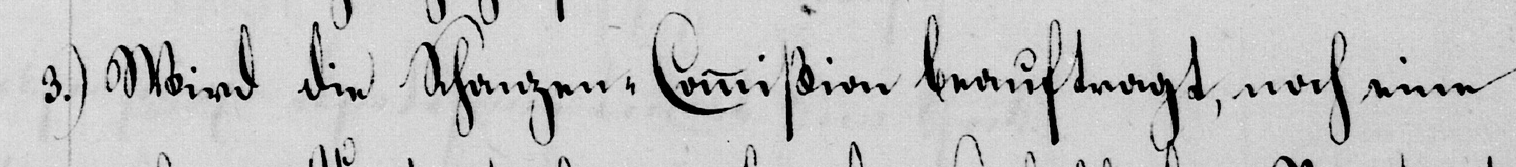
3.) Wird die Schanzen-Commißion beauftragt, noch eine
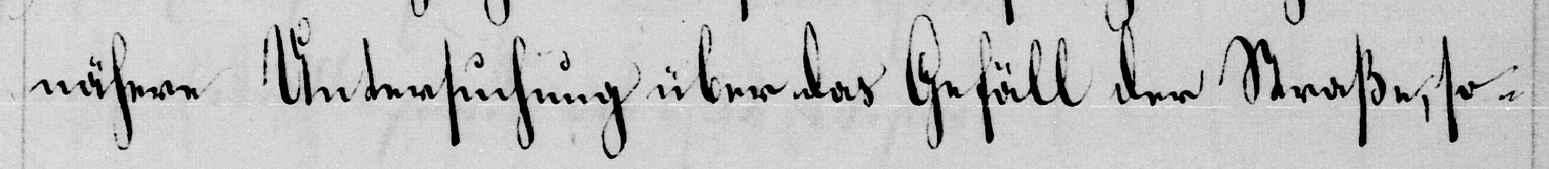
nähere Untersuchung über das Gefäll der Straße, so-
